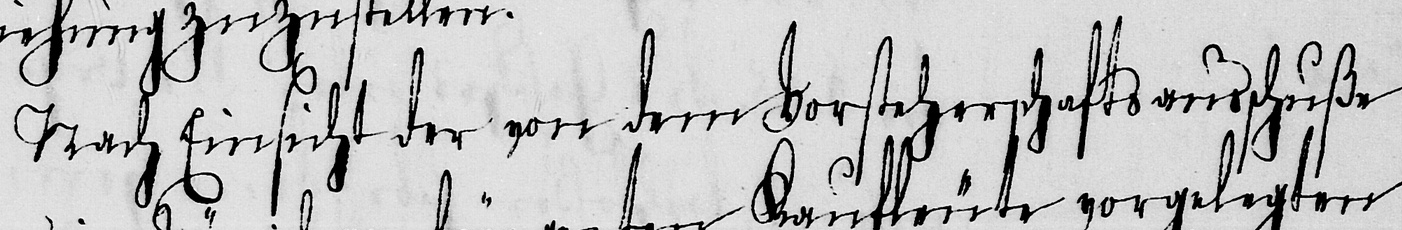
Nach Einsicht der von dem Vorsteherschaftsausschuße
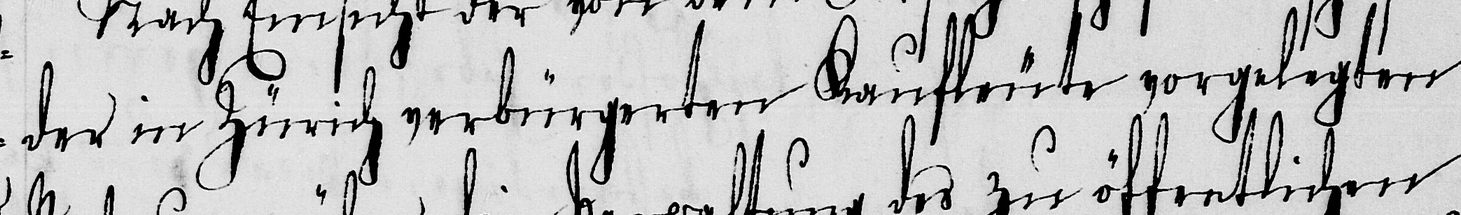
der in Zürich verbürgerten Kaufleute vorgelegten
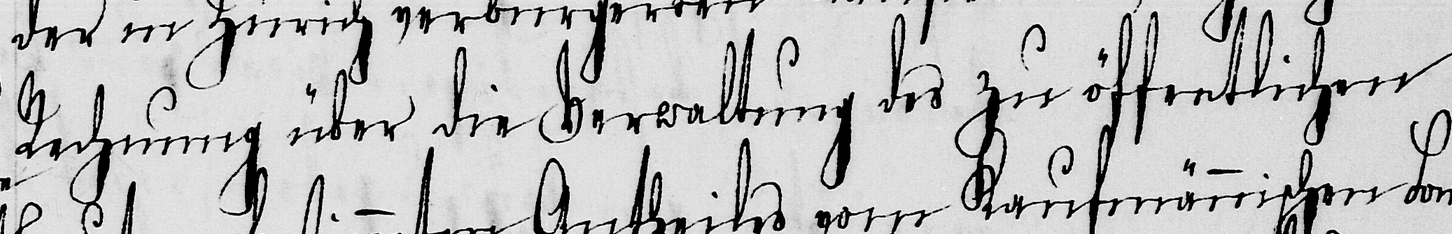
Rechnung über die Verwaltung des zu öffentlichen
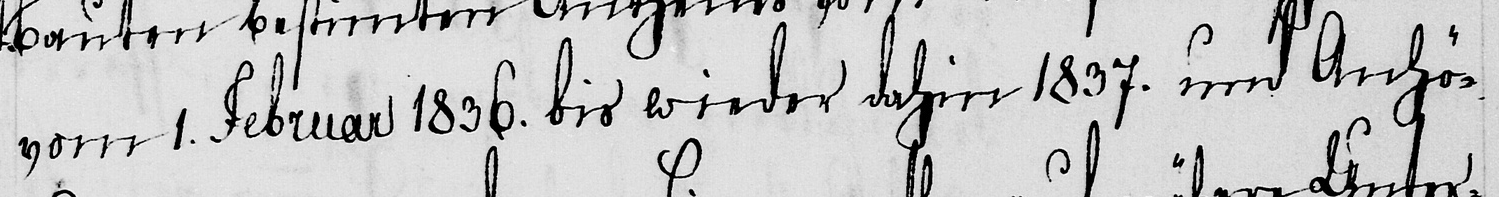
vom 1. Februar 1836. bis wieder dahin 1837. und Anhö¬
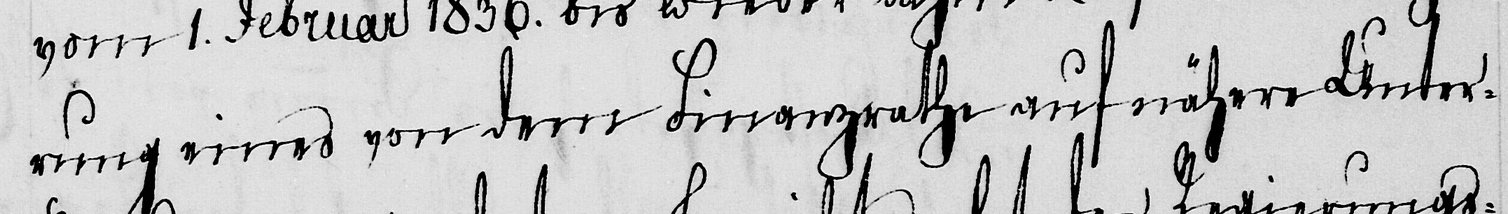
rung eines von dem Finanzrathe auf nähere Unter¬
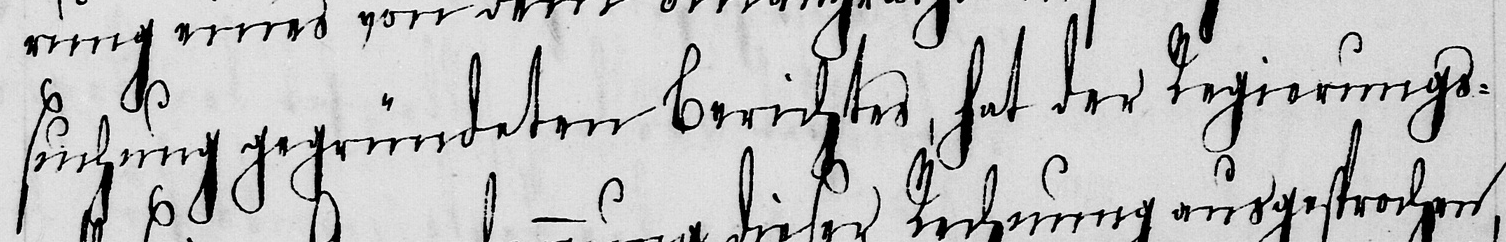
suchung gegründeten Berichtes, hat der Regierungs¬
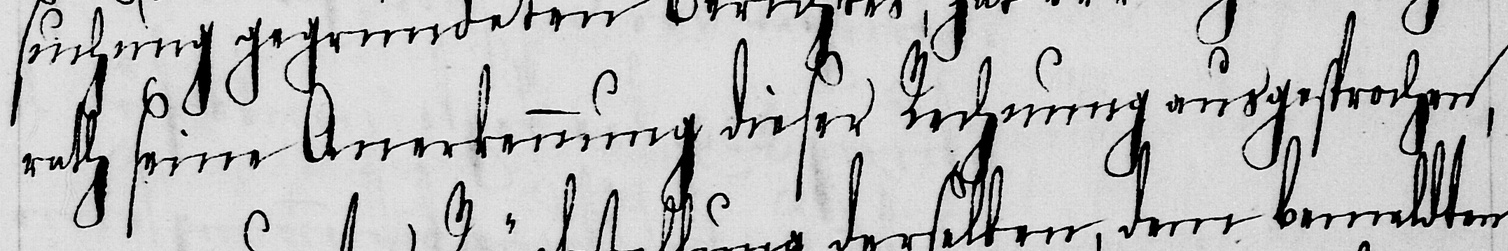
rath seine Anerkennung dieser Rechnung ausgesprochen,
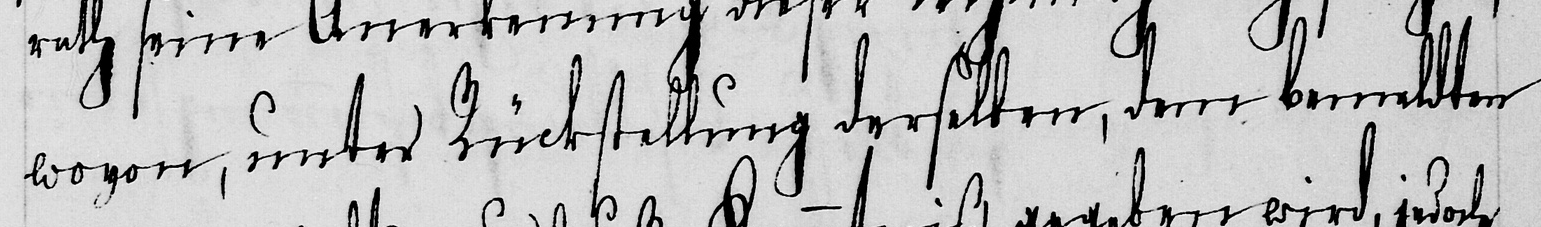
wovon, unter Rückstellung derselben, dem bemeldten
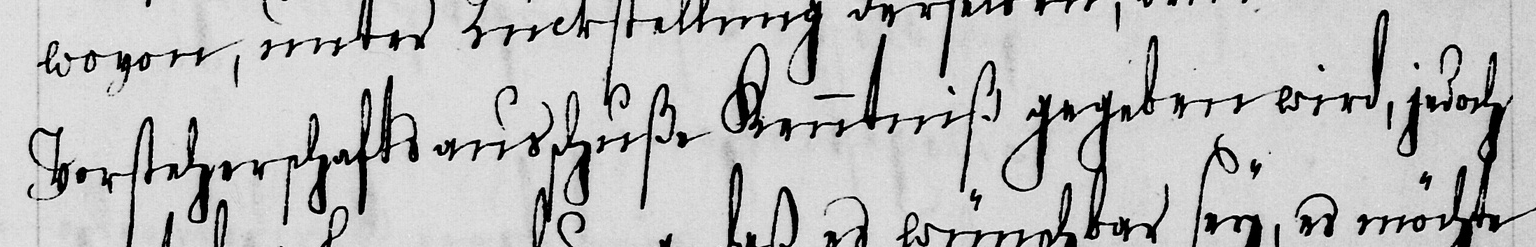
Vorsteherschaftsausschuße Kenntniß gegeben wird, jedoch
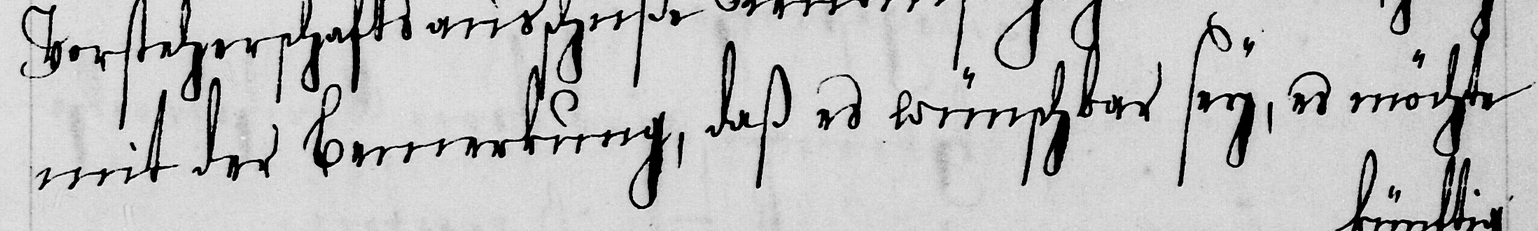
mit der Bemerkung, daß es wünschbar sey, es möchte
